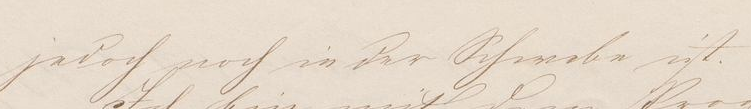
jedoch noch in der Schwebe ist.
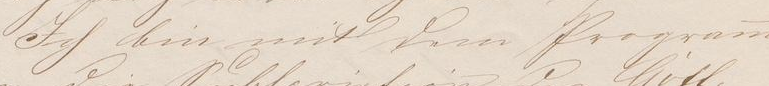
Ich bin mit dem Programm
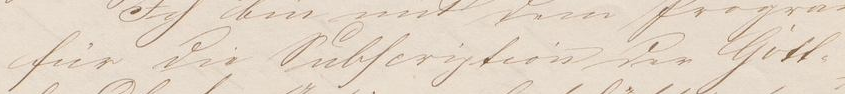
für die Subscription der Gott-
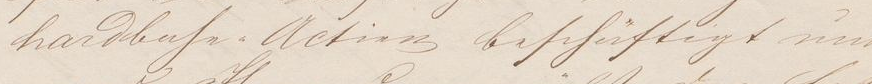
hardbahn-Actien beschäftigt und
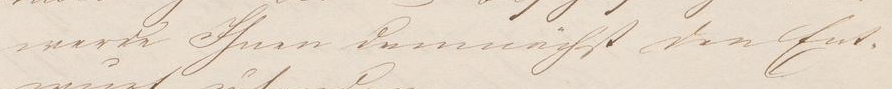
werde Ihnen demnächst den Ent-
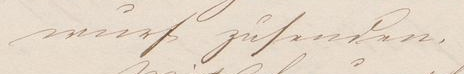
wurf zusenden.
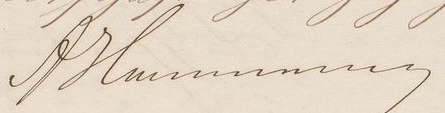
A Hansemann
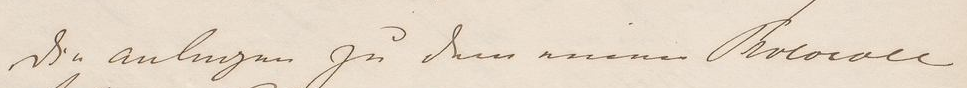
Die Anlagen zu dem einen Protocoll
